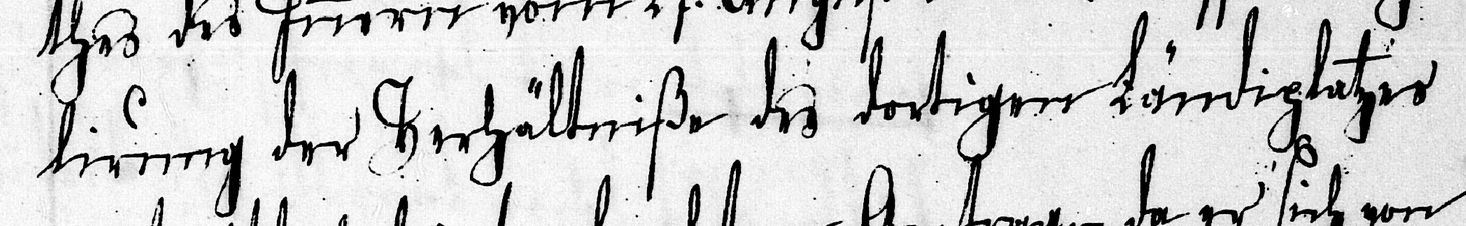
lirung der Verhältniße des dortigen Ländiplatzes
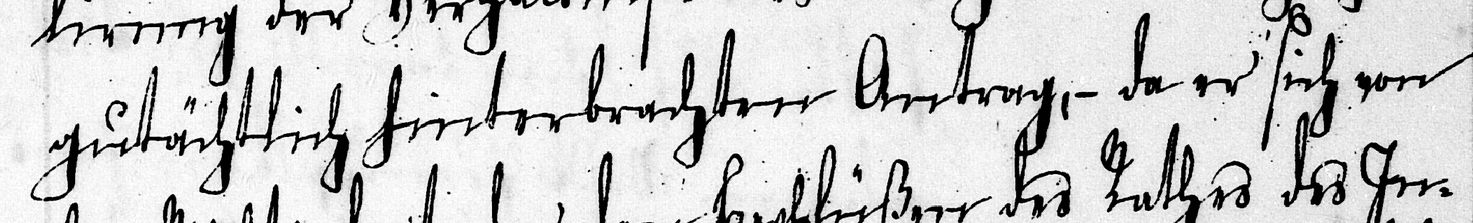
gutächtlich hinterbrachten Antrag, – da er sich von
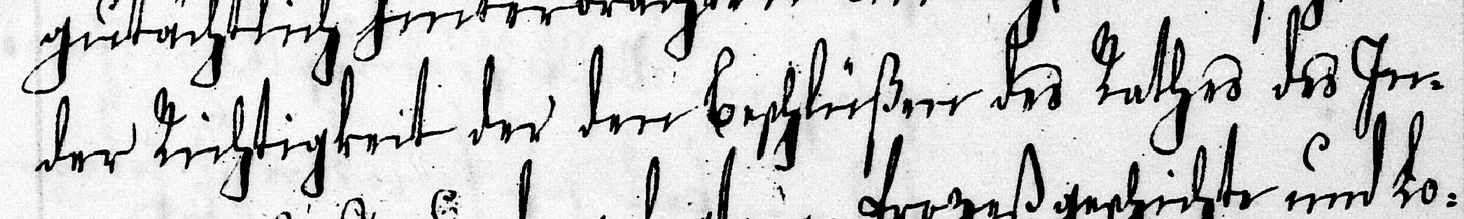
der Richtigkeit der den Beschlüßen des Rathes des In¬
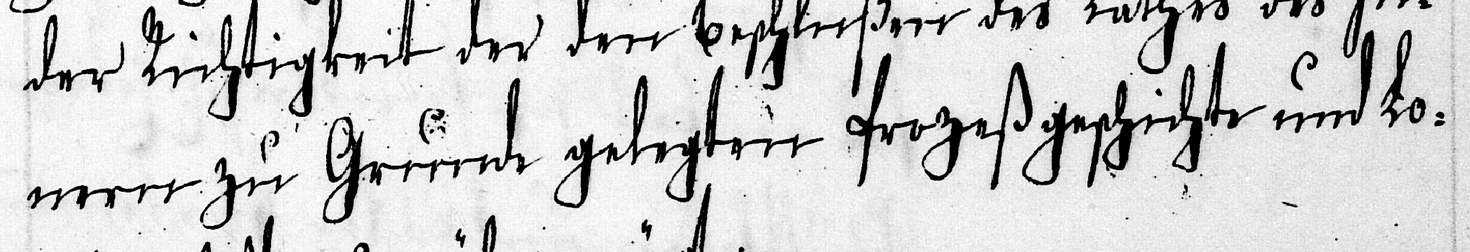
nern zu Grunde gelegten Prozeßgeschichte und Lo¬
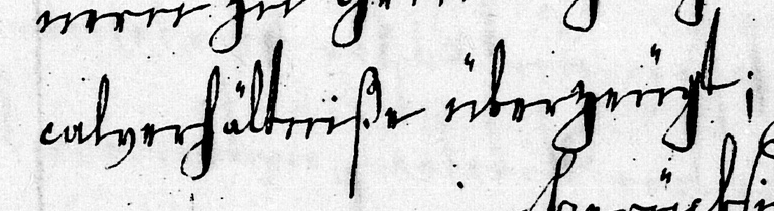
calverhältniße überzeugt;
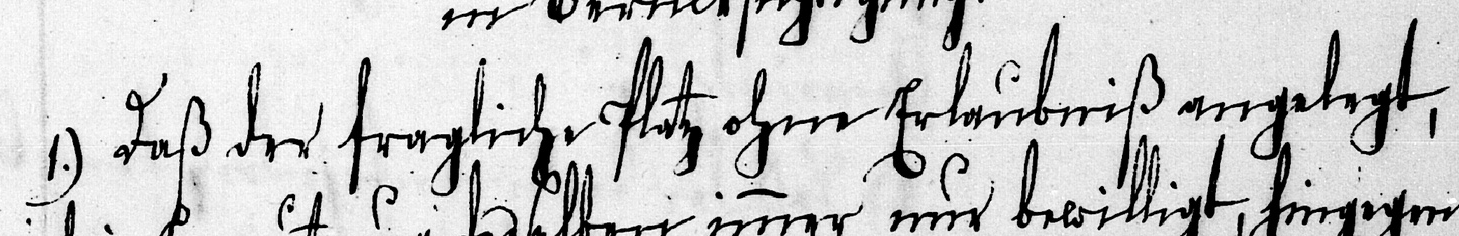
1.) Daß der fragliche Platz ohne Erlaubniß angelegt,
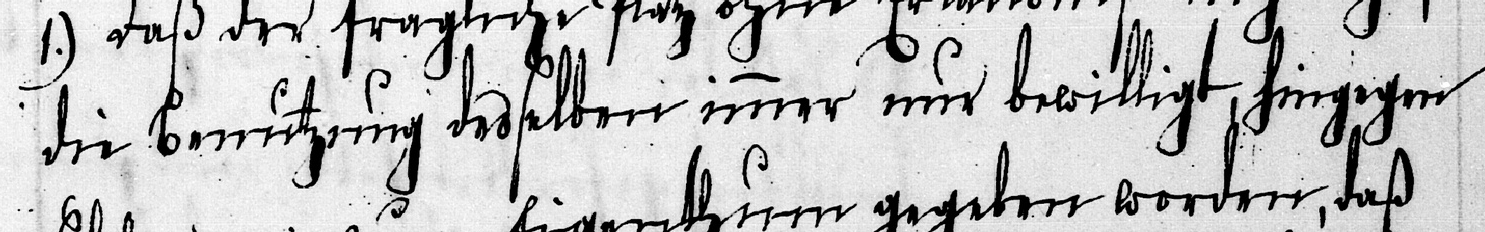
die Benutzung desselben immer nur bewilligt, hingegen
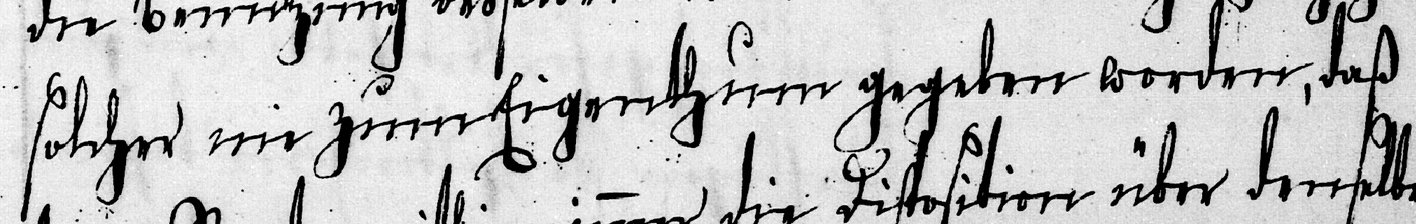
solcher nie zum Eigenthum gegeben worden, daß
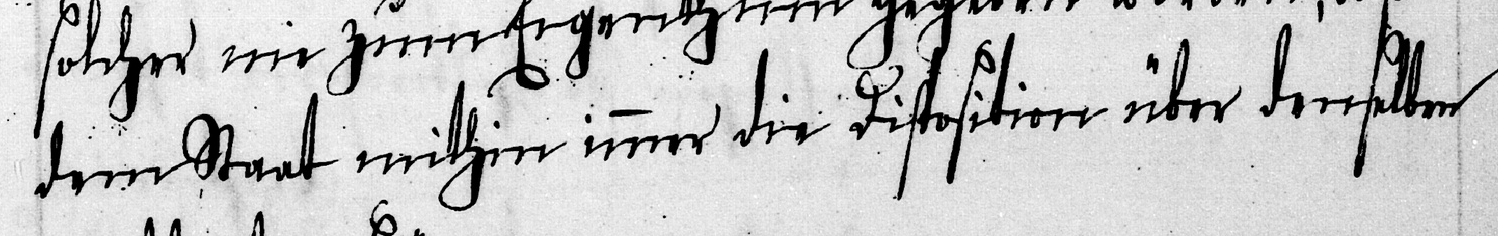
dem Staat mithin immer die Disposition über denselben
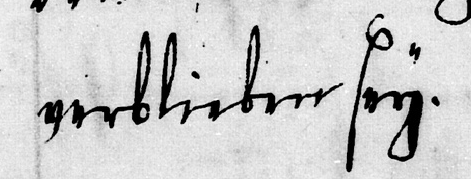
verblieben sey.
